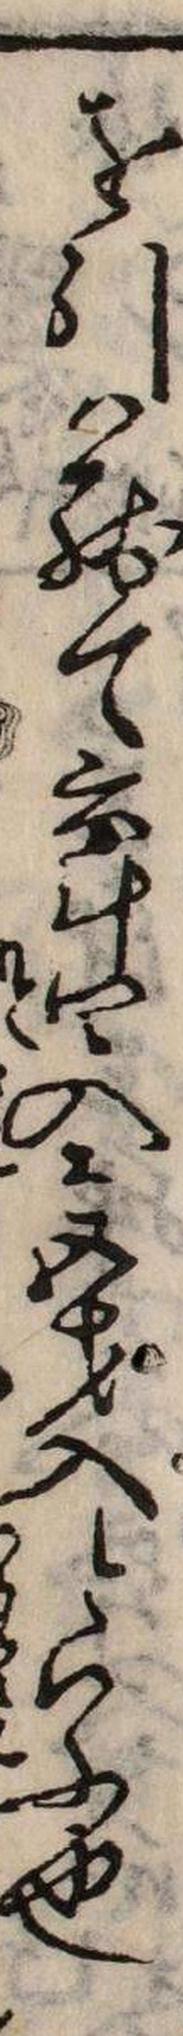を引は残て六斗四合五才入といふ也
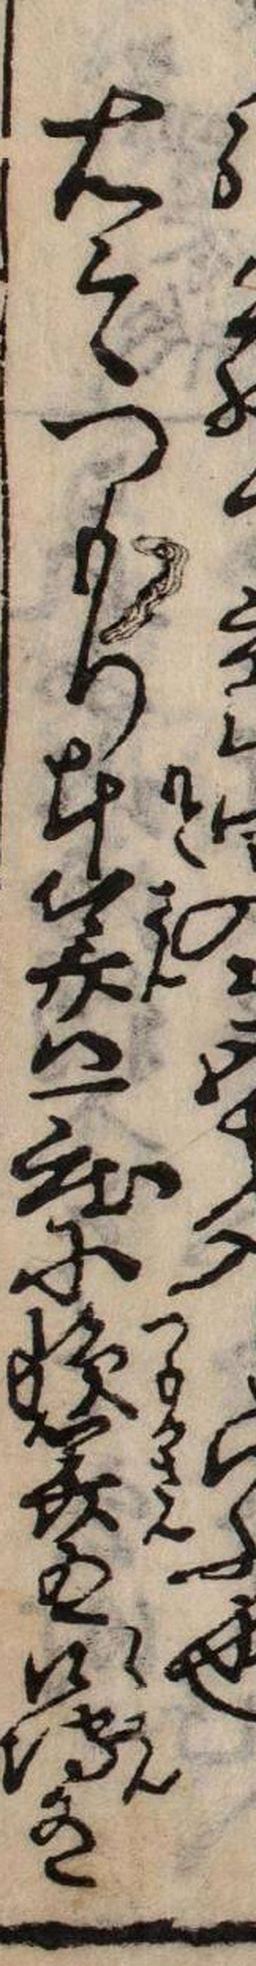右之つもり本算は一度に積算有口伝有

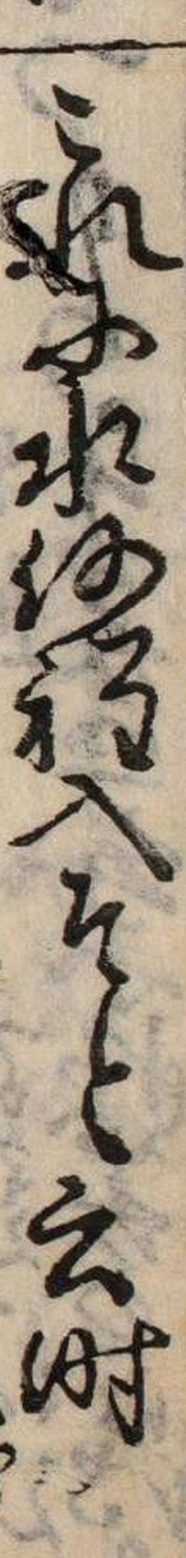これに水何程入そと云時
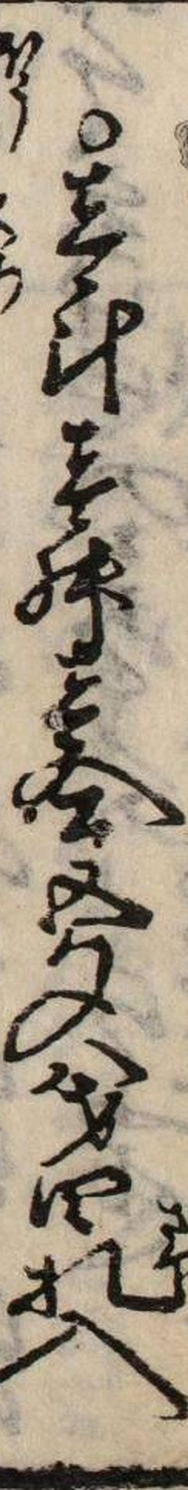○壱斗壱升壱合五勺八才四札入
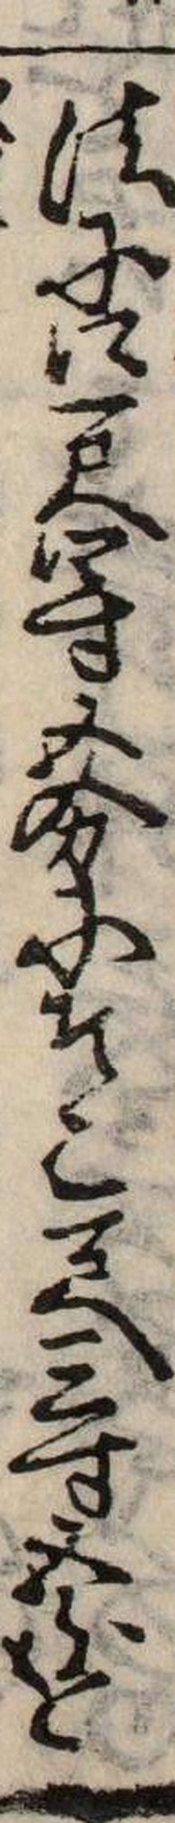法に口一尺四寸五分にそこ一尺三寸五分
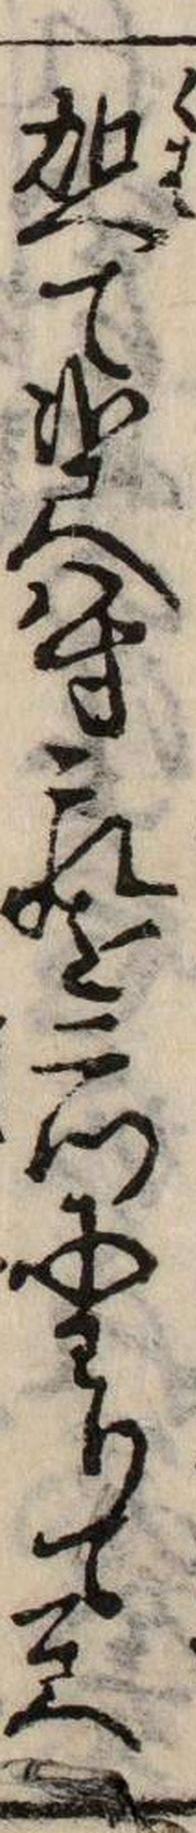加へて弐尺八寸これを二つにわりて一尺
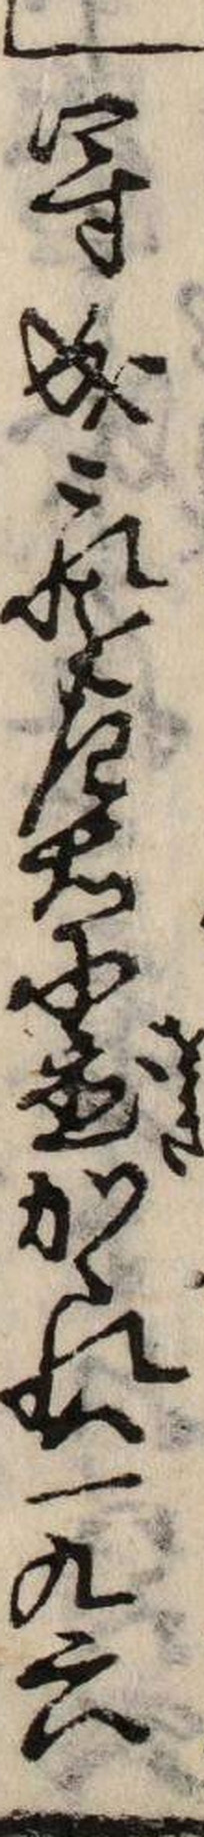四寸成これを左右に置かくれは一九六
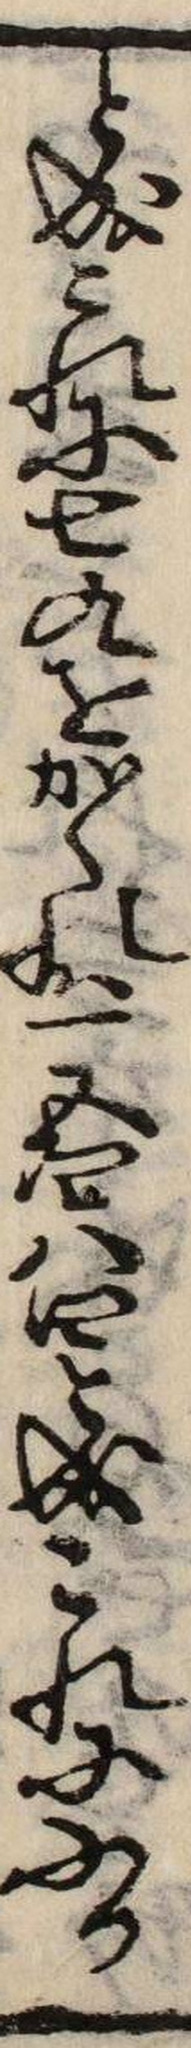と成これに七九をかくれは一五四八四と成これにふか
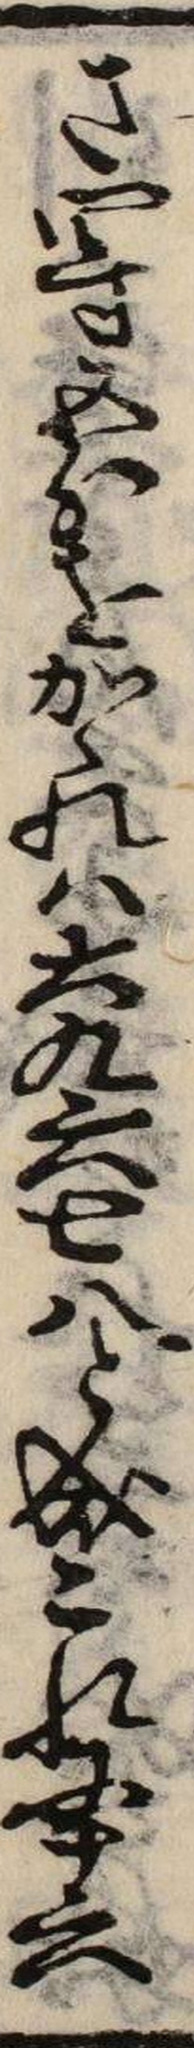さ四寸五分をかくれは六九六七八と成これに十六
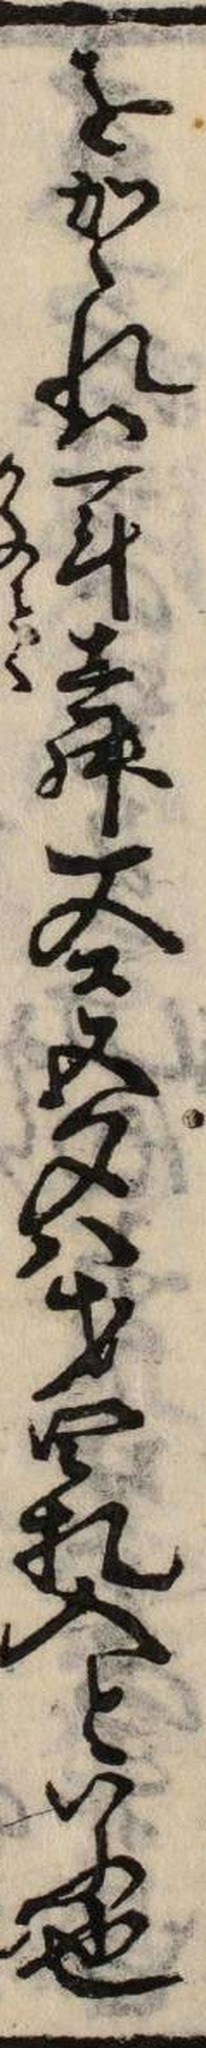をかくれは一斗壱升一合五勺八才四札入といふ也
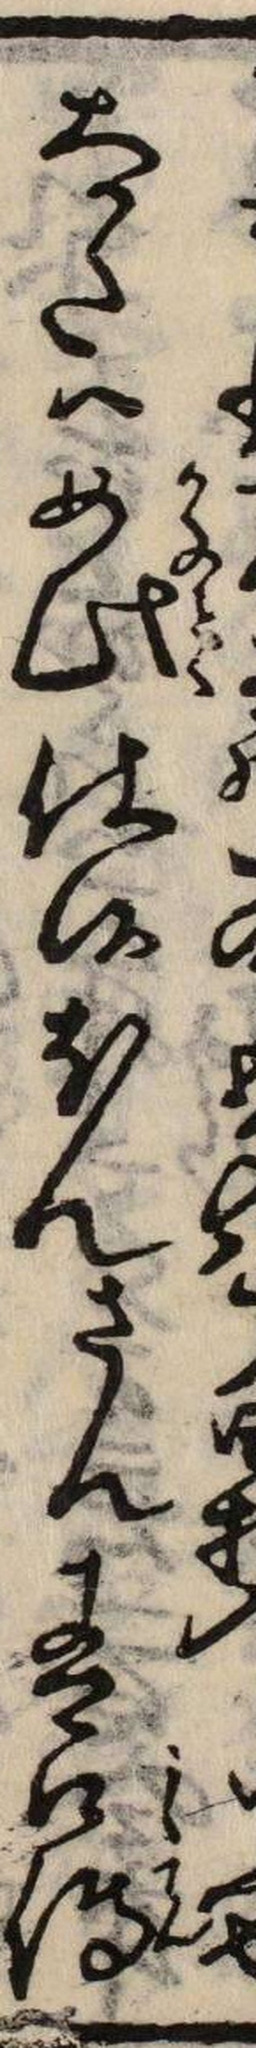大かたは如此仕候ほんさんは口伝
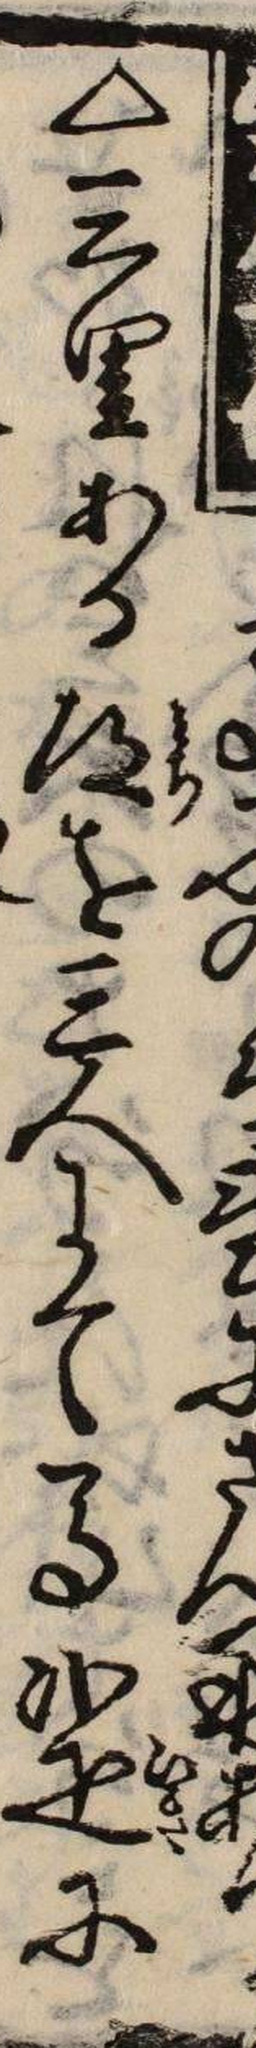△三里ある道を三人にて馬弐疋に
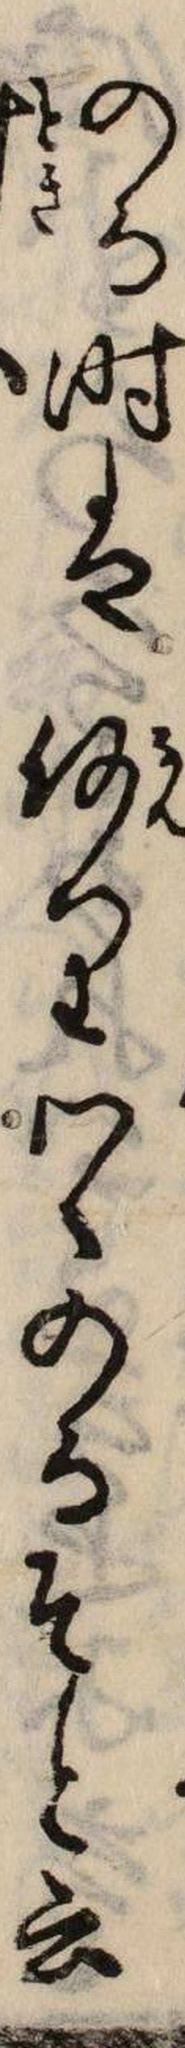のる時は何里つつのるそと云
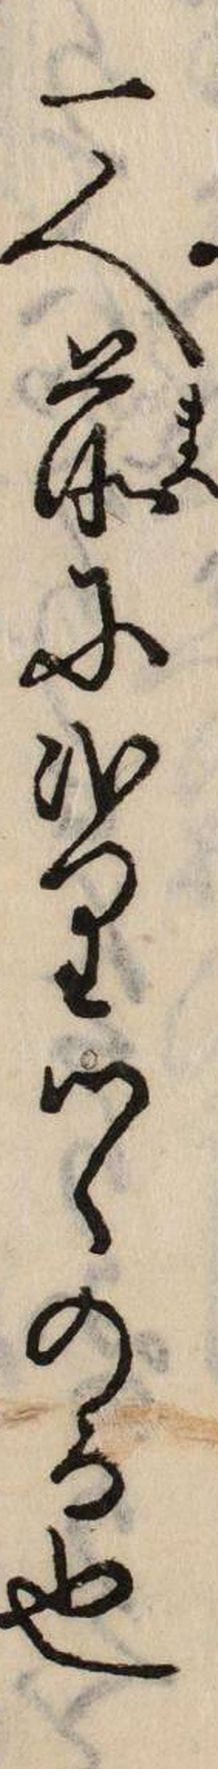一人前に弐里つつのる也
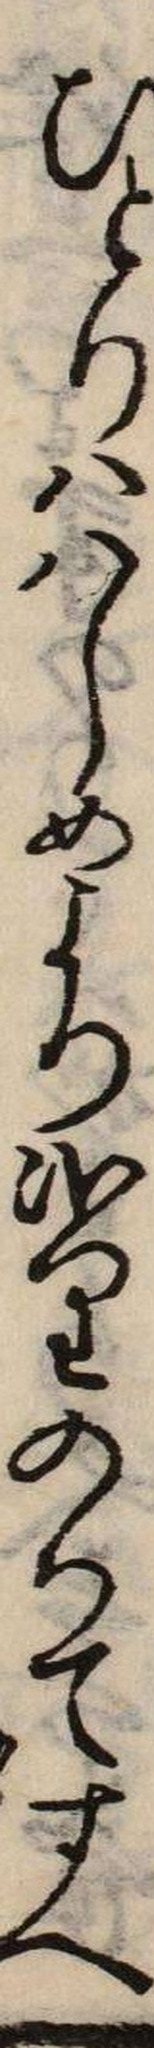ひとりはしめより弐里のりてすへ
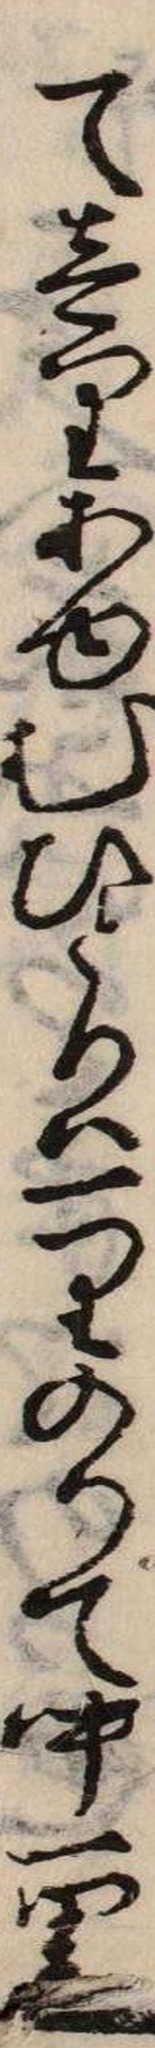て壱里あゆむひとりは一里のりて中一里
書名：塵劫記（寛永11年自跋、京都府立京都学・歴彩館追貴8）
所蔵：京都府立京都学・歴彩館 国文学研究資料館
